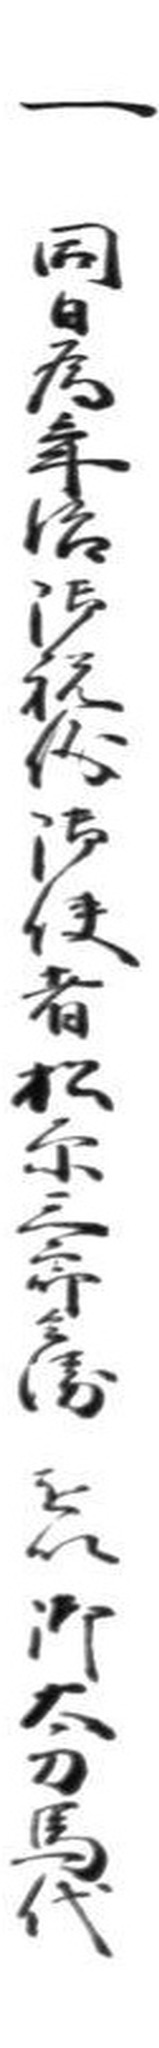一同日年始御祝儀御使者松原三郎兵衛を以御太刀馬代
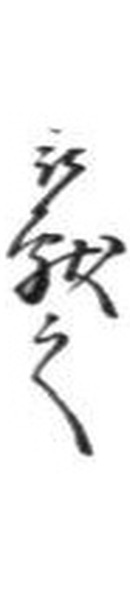被献之
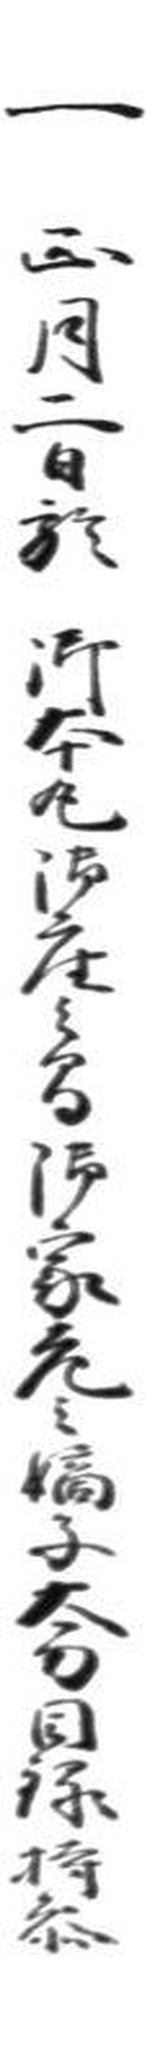一正月二日於御本丸御座之間御家老之嫡子太刀目録持参
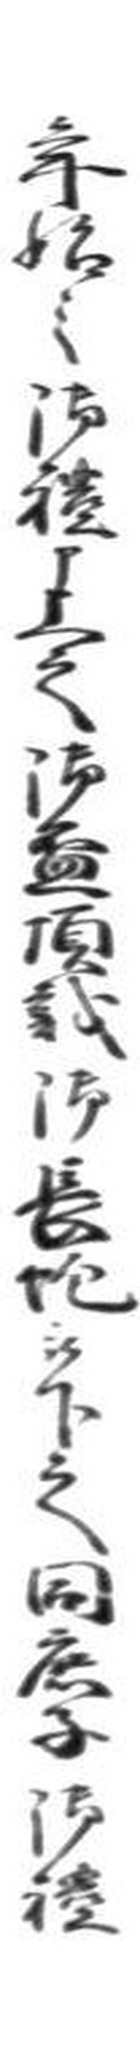年始之御礼申上之御盃頂戴御長蚫被下之同庶子御礼
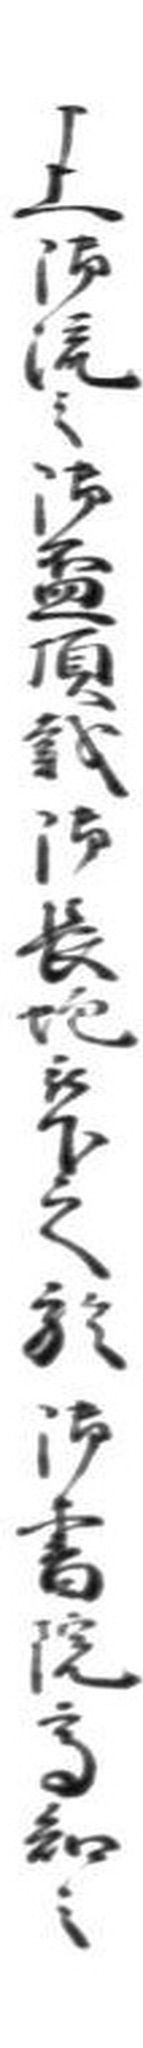申上御流之御盃頂戴御長蚫被下之於御書院高知之
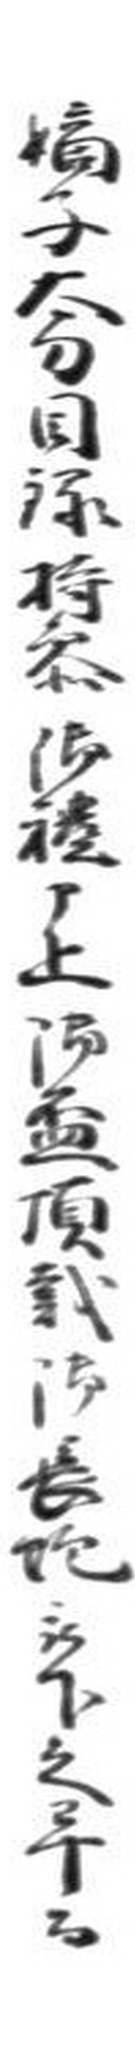嫡子太刀目録持参御礼申上御盃頂戴御長蚫被下之畢而
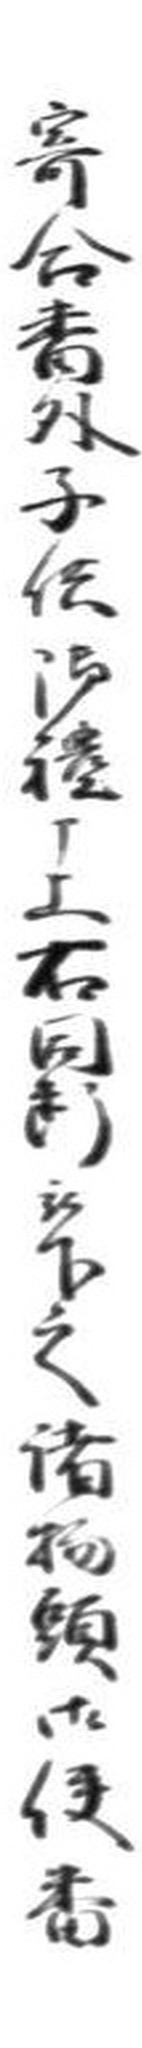寄合番外子供御礼申上右同断被下之諸物頭御使番
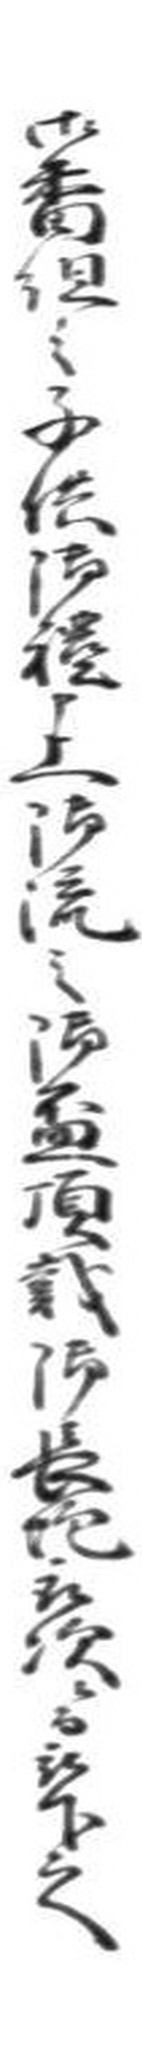御番組之子供御礼申上御流之御盃頂戴御長蚫取次ニ而被下之

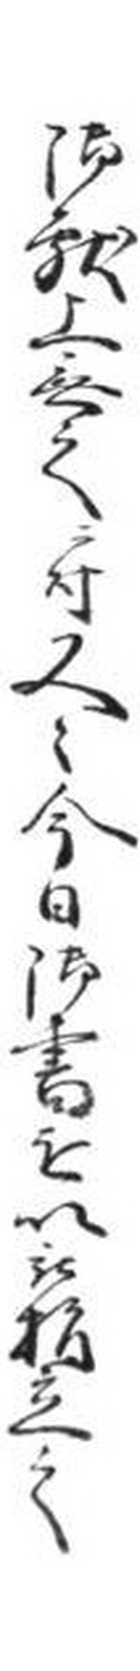御献上無之二付又々今日御書を以被指立之
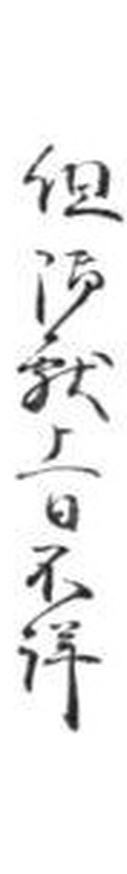但御献上日不詳
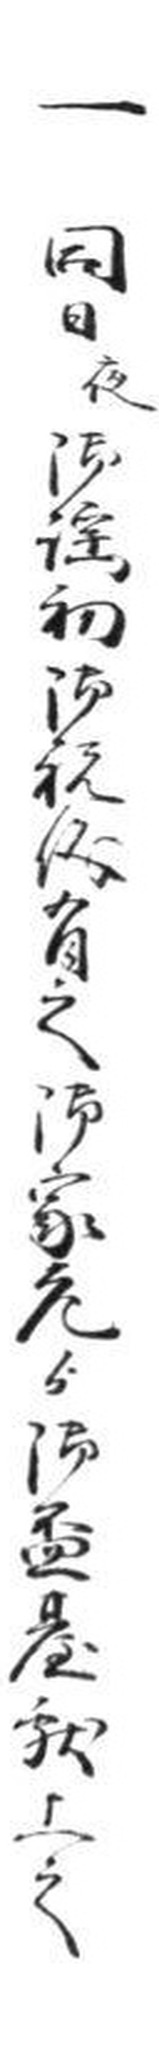一同日夜御謡初御祝儀有之御家老ゟ御盃台献上之
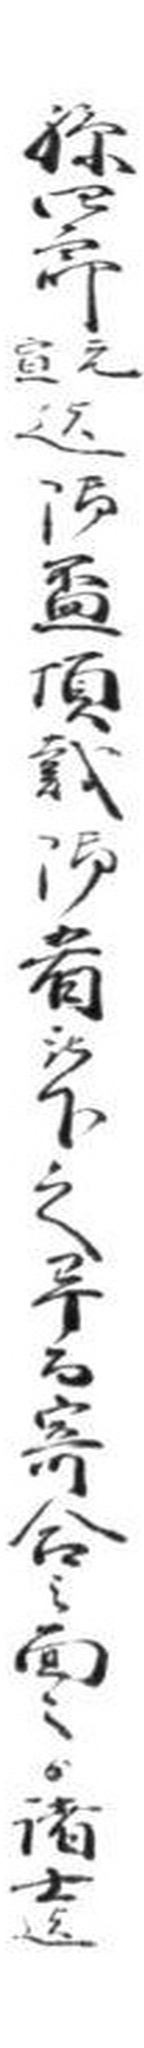孫四郎元宣迄御盃頂戴御肴被下之畢而寄合之面々ゟ諸士迄
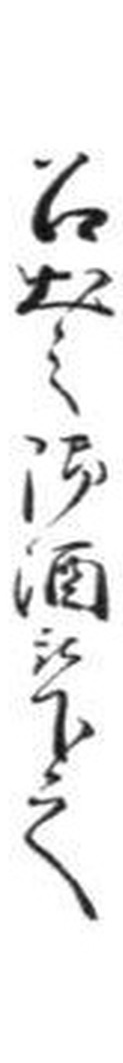召出之御酒被下之
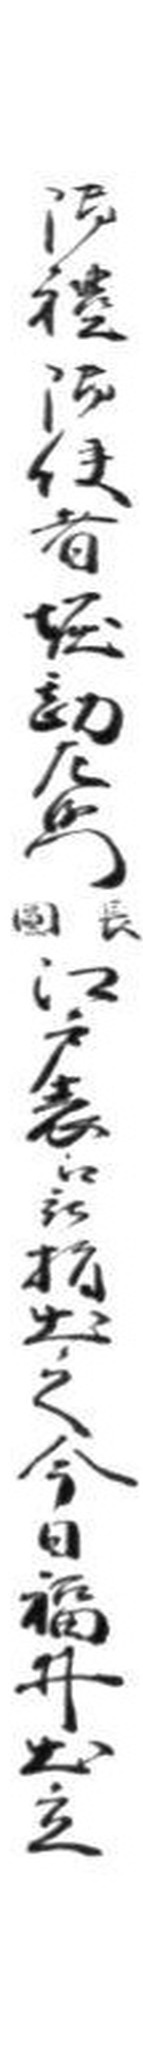御礼御使者堀勘左衛門長圓江戸表江被指出之今日福井出立
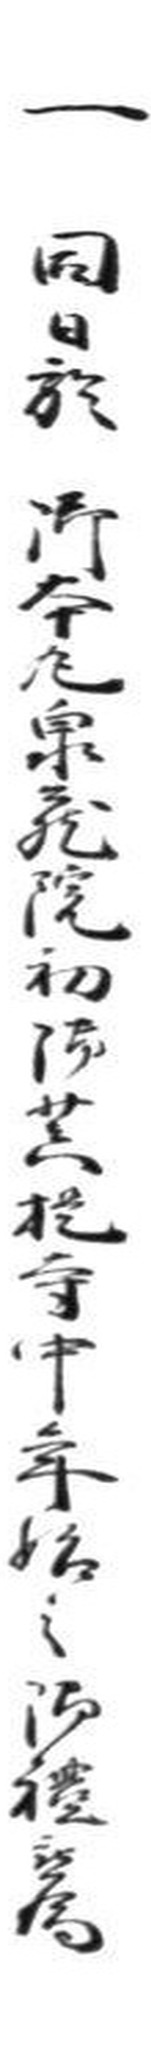一同日於御本丸泉蔵院初御菩提寺中年始之御礼被為
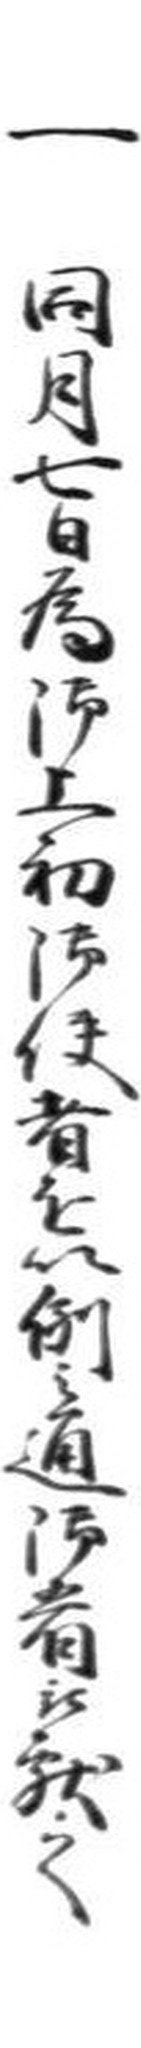一同月七日為御上初御使者を以例之通御肴被献之
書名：家譜 十七 吉品公 従元禄元年到同二年
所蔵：福井県文書館 Fukui Prefectural Archives
